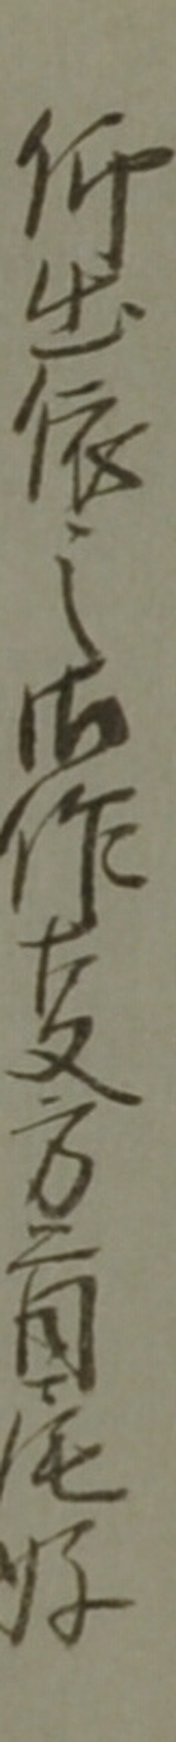仰出依之御作事方首尾好
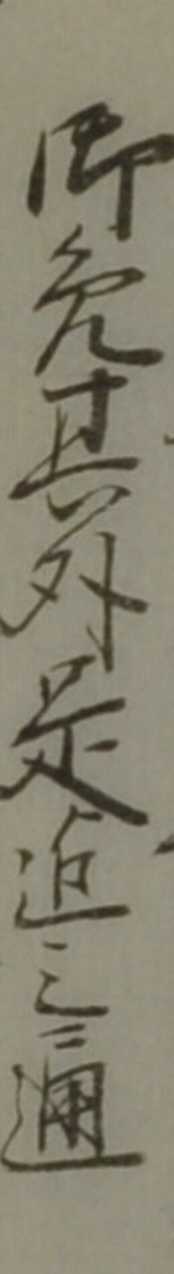御免其外是迄之通
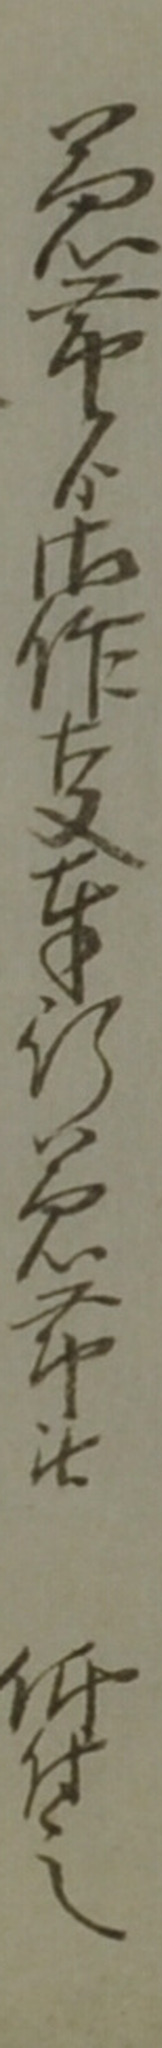兼帯ゟ御作事奉行兼帯被仰付之
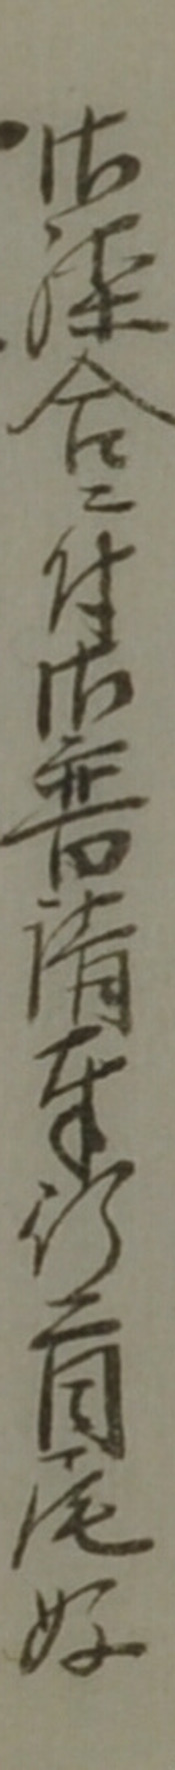御繰合ニ付御普請奉行首尾好
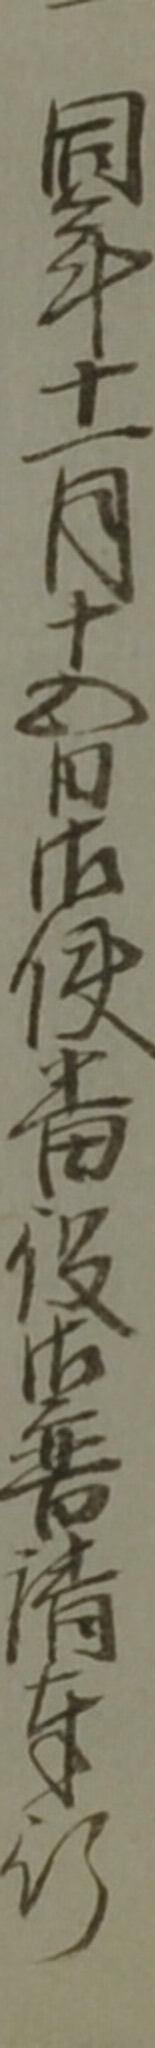一同年十一月十五日御使番役御普請奉行
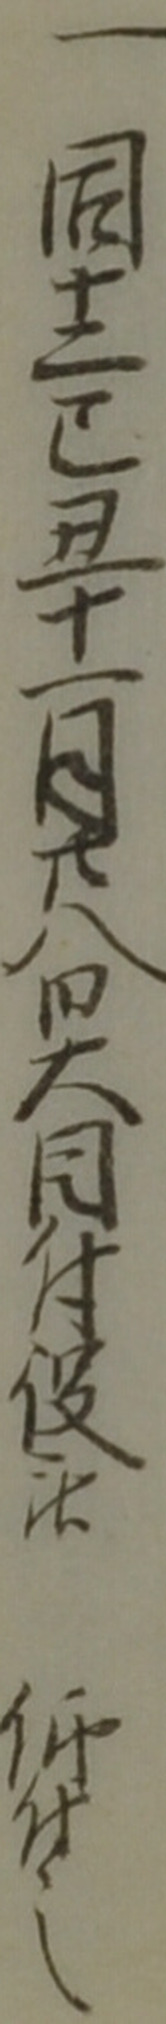一同十二己丑十一月廿八日大目付役被仰付之
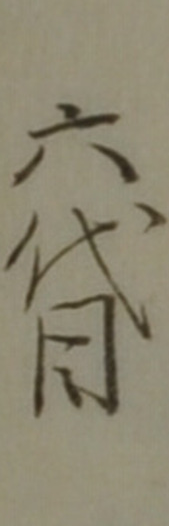六代目
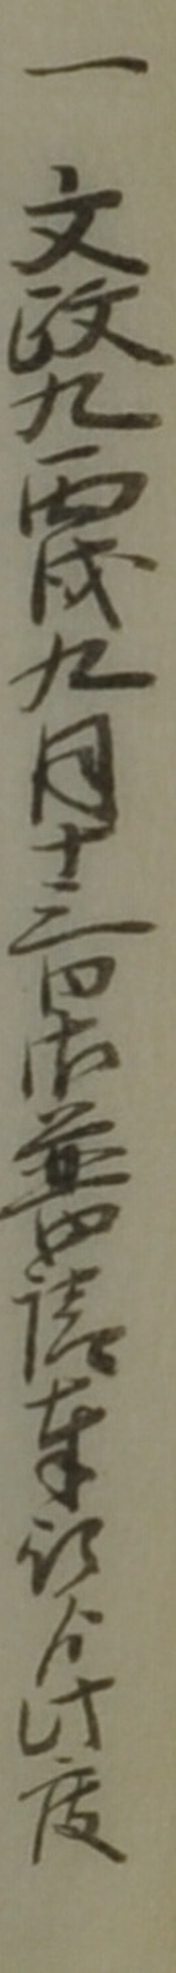一文政九丙戌九月十三日御普請奉行ゟ此度
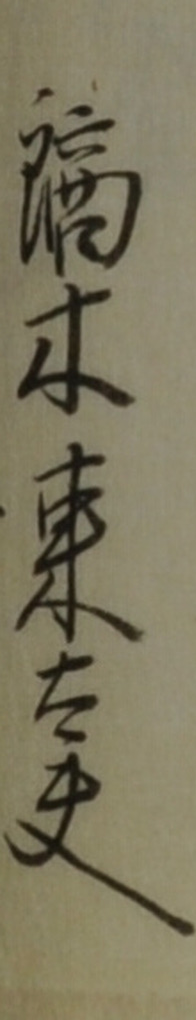鏑木東太夫
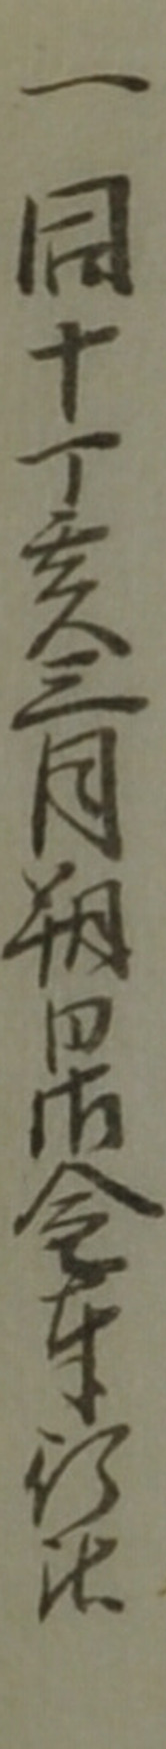一同十丁亥三月朔日御金奉行被
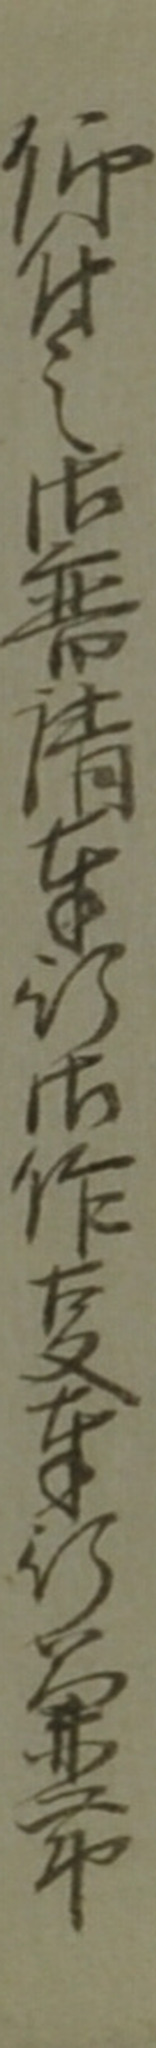仰付之御普請奉行御作事奉行兼帯
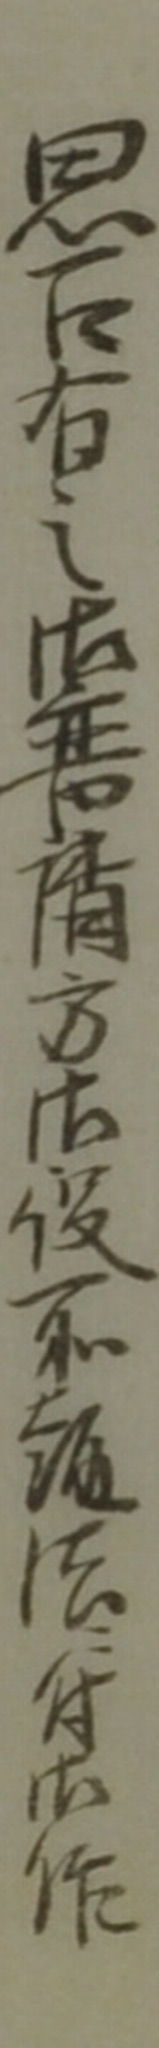思召有之御普請方御役所趣法ニ付御作
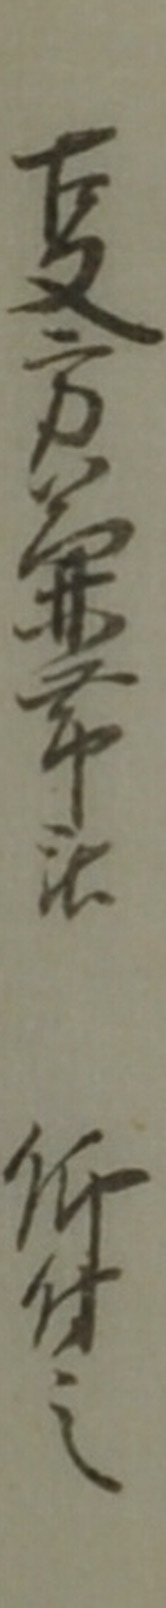事方兼帯被仰付之
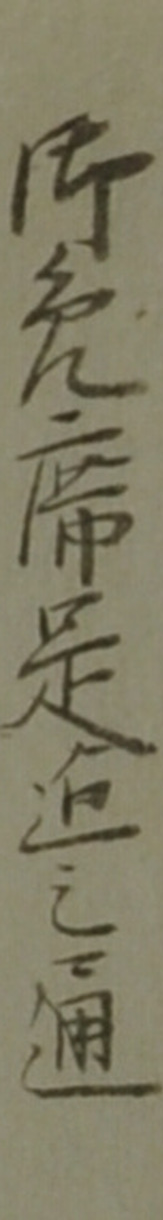御免席是迄之通
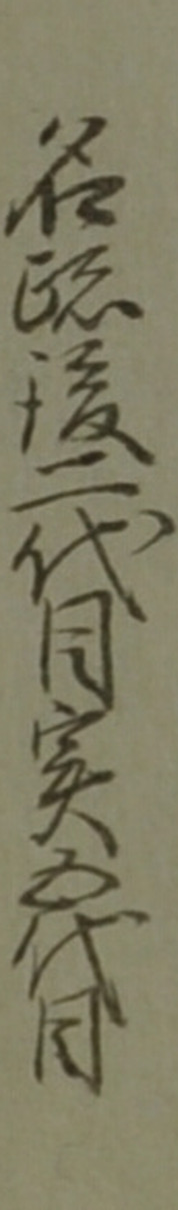名跡後二代目実五代目
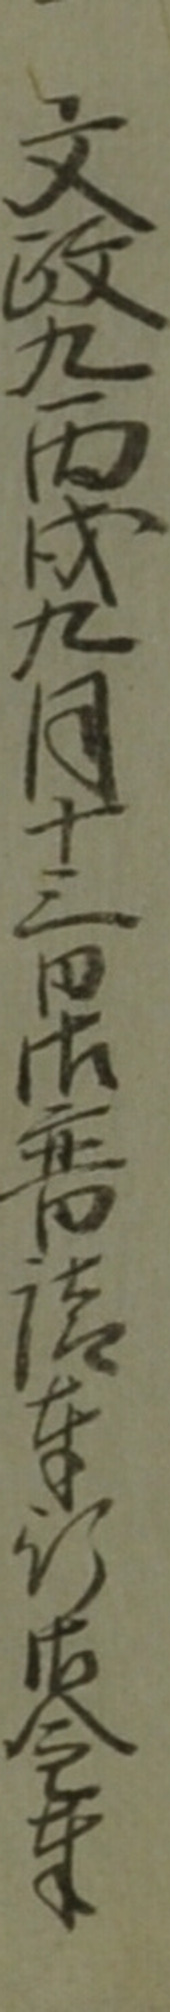一文政九丙戌九月十三日御普請奉行御金奉
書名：諸御役代々録（六）
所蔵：伊那市立高遠町図書館・合同会社AMANE
